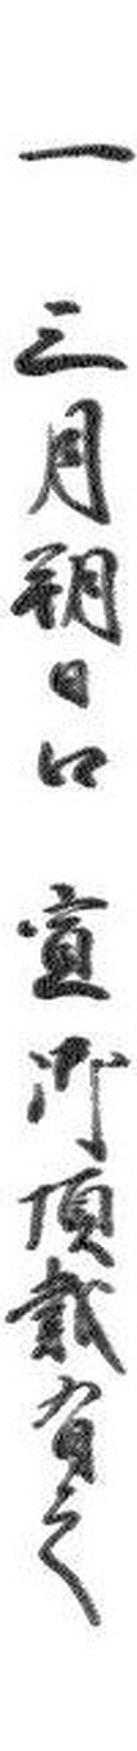一三月朔日口宣御頂戴有之
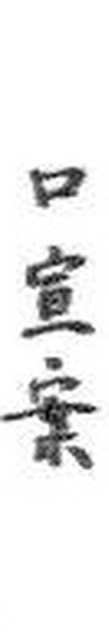口宣案
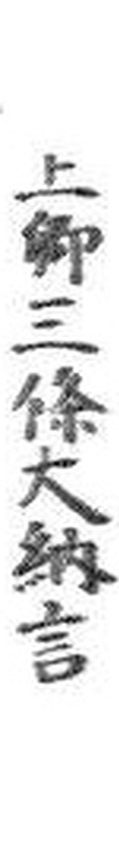上卿三条大納言
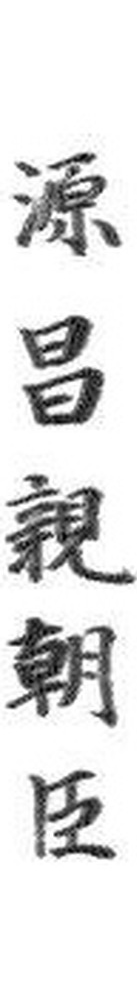源昌親朝臣
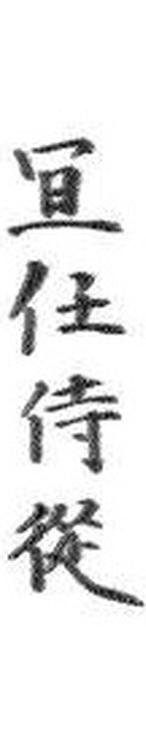宜任侍従

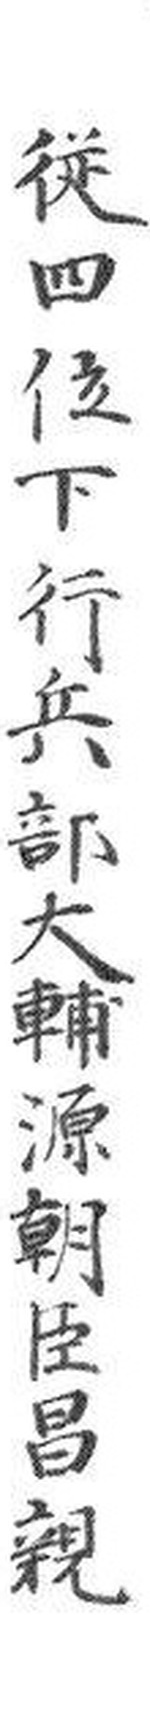従四位下行兵部大輔源朝臣昌親
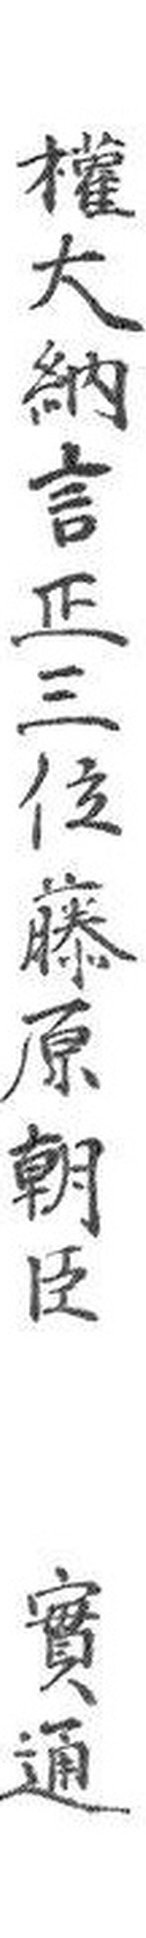権大納言正三位藤原朝臣実通
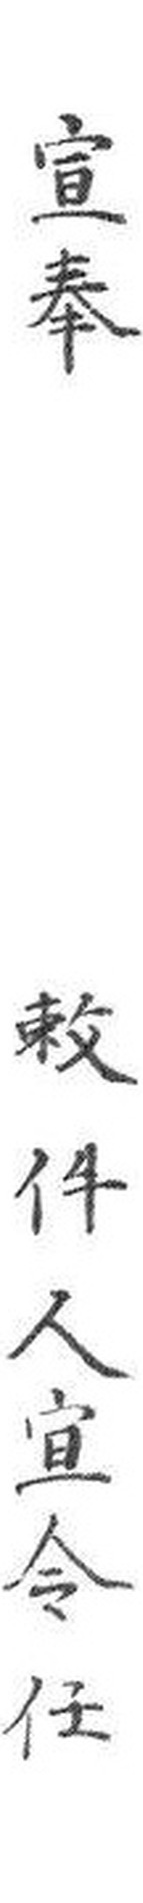宣奉勅件人宜令任
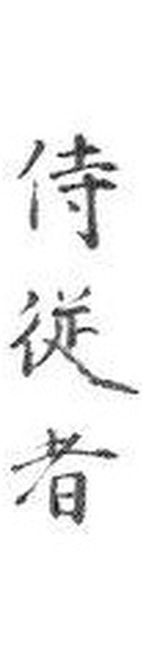侍従者
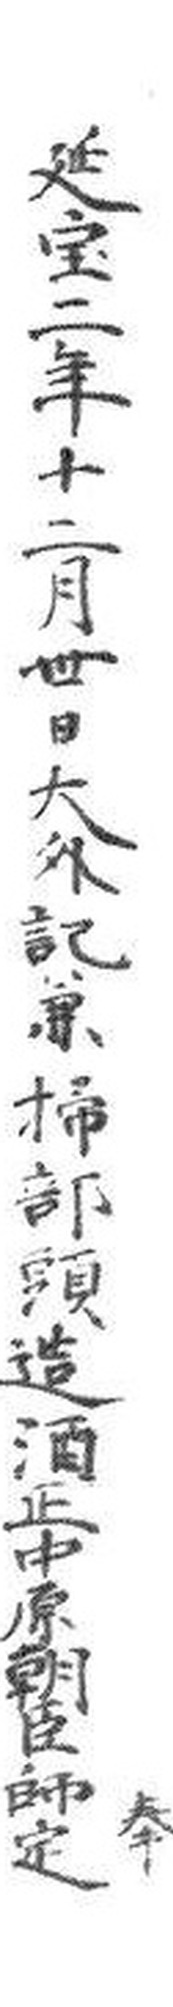延宝二年十二月卅日大外記兼掃部頭造酒正中原朝臣師貞
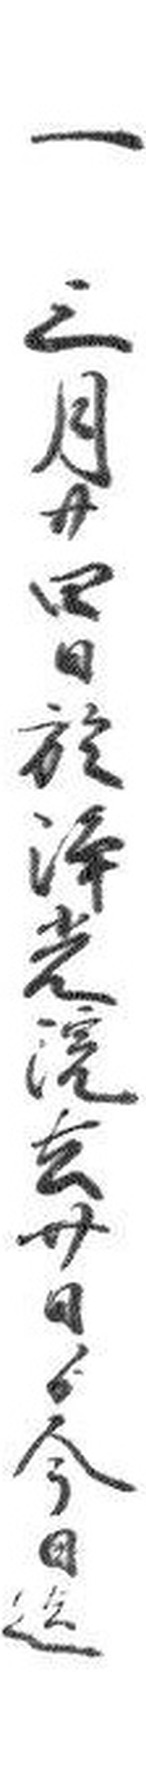一三月廿四日於浄光院去廿日ゟ今日迄
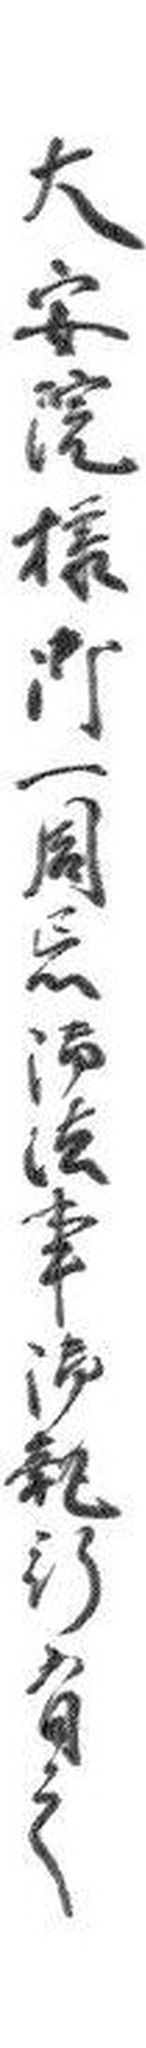大安院様御一周忌御法事御執行有之
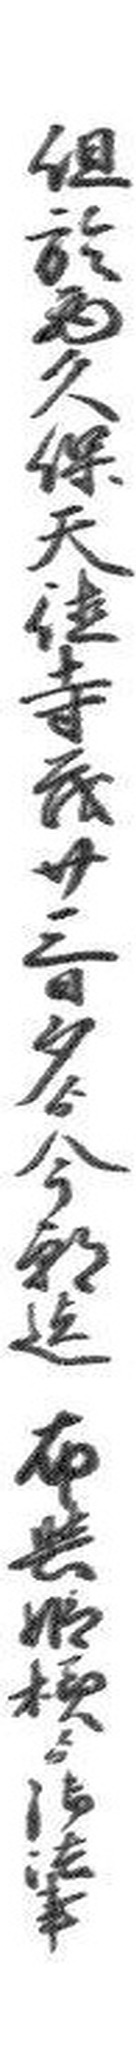但於西久保天徳寺茂廿三日夕ゟ今朝迄布与姫様ゟ御法事
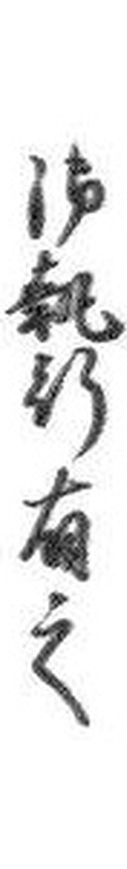御執行有之
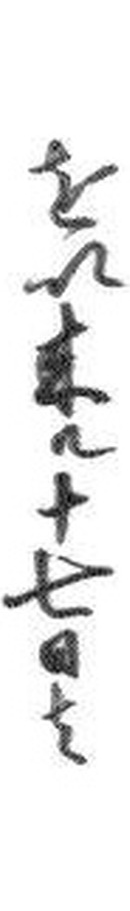を以来ル十七日者
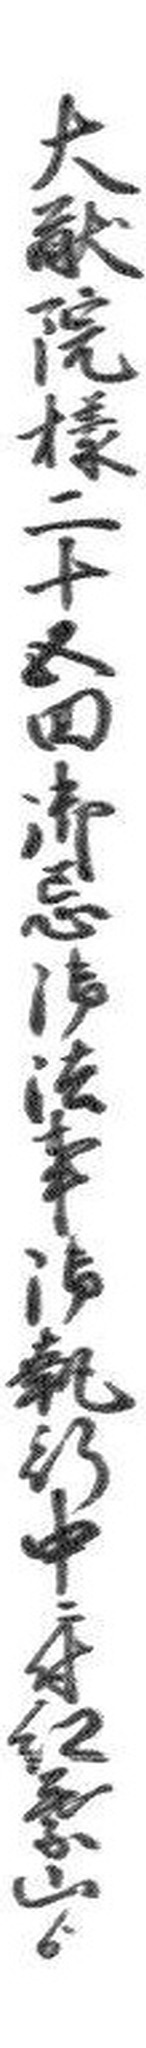大猷院様二十五回御忌御法事御執行中ニ付紅葉山ゟ
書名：家譜 十一 昌親公 従延宝二年到延宝四年八月
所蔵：福井県文書館 Fukui Prefectural Archives
